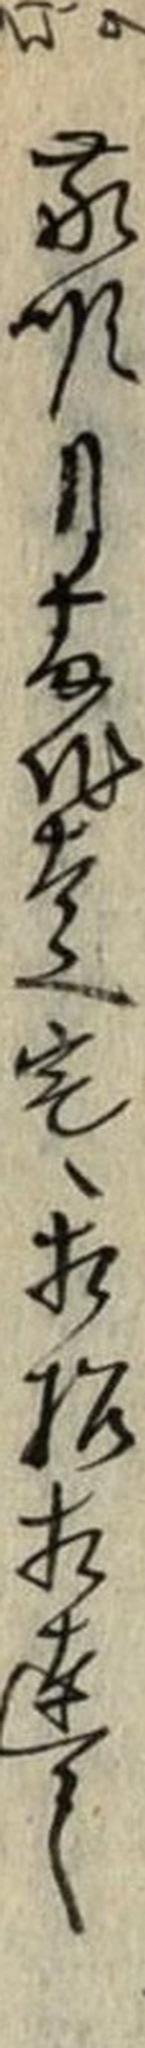敬順月番作太夫宅へ相招相達之
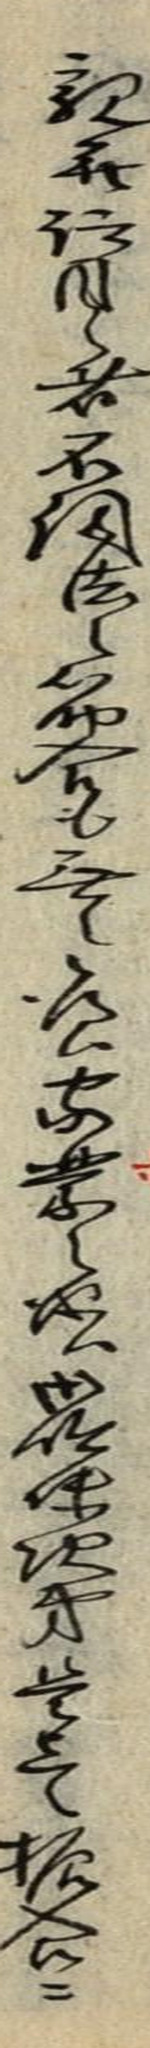親并跡目之者不調法之筋合も無之候得は家業之儀は御吟味次第是迄之振合に
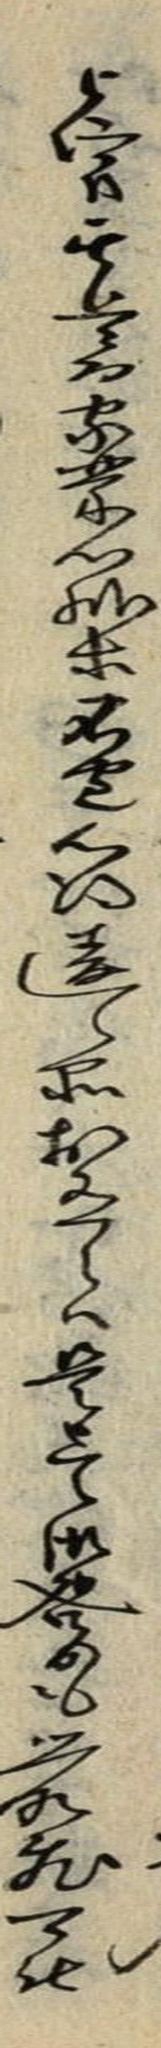被仰付其上に而家業心掛等不宜心得違之品於有之は是迄之御咎ゟも厳敷可被
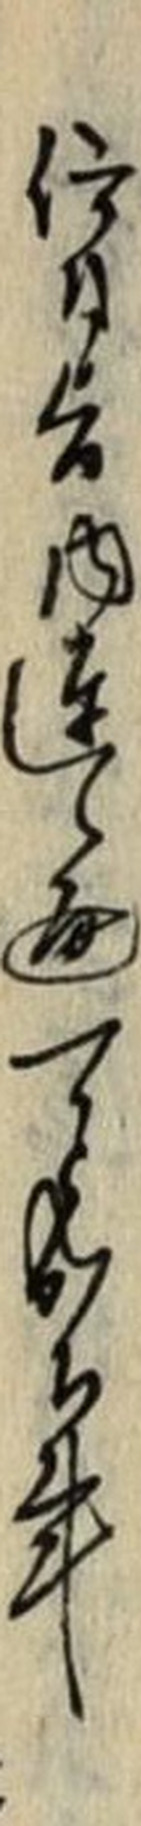仰付旨内達之通可被成下事
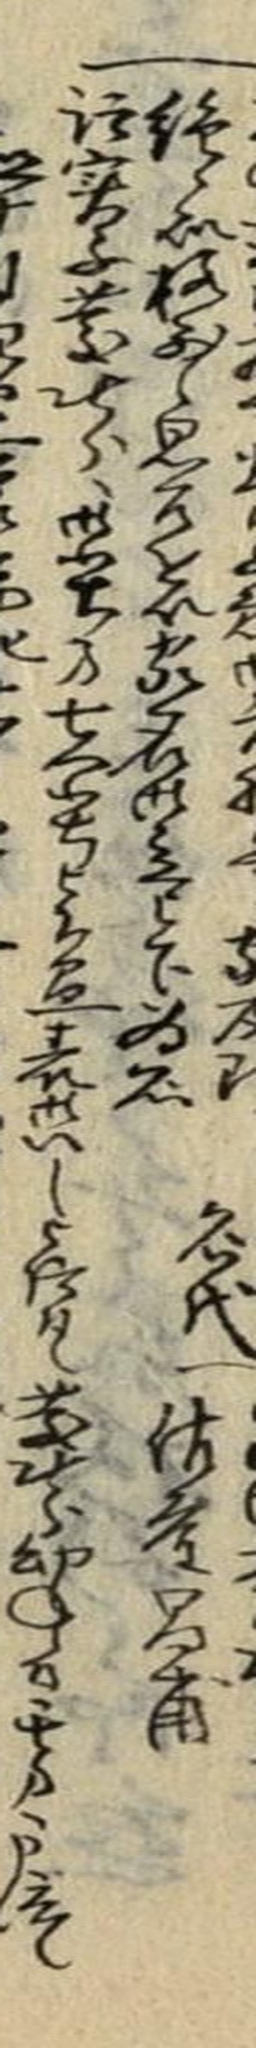跡実子慶次郎へ御ふち方七人ふち被下置表御いし被仰付候慶次郎幼年に付其方へ申渡之
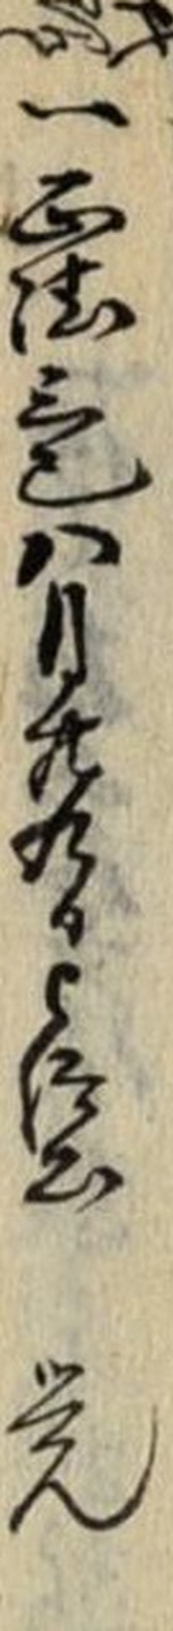一正徳三巳八月廿九日被仰出覚
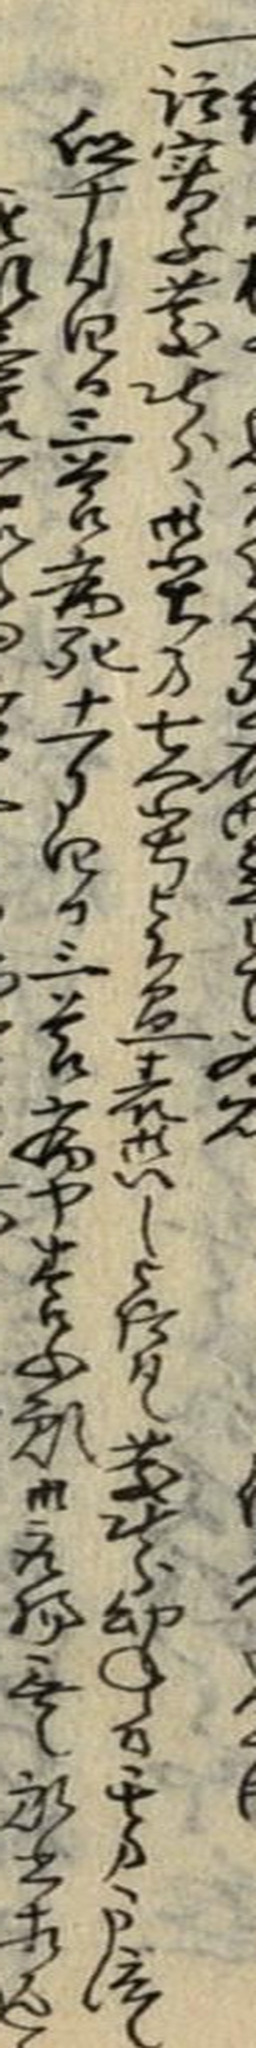但十月四日三節病死十一月四日三節病中養子願御取揚無之願書相返候
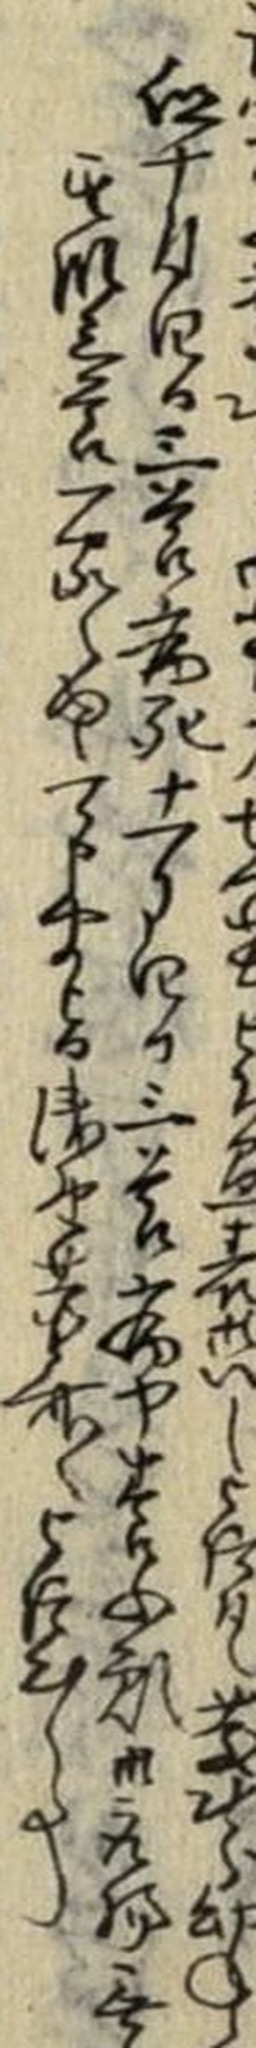其段三節一家之内へ可申聞候旨浅野恭斎へ被仰出候事
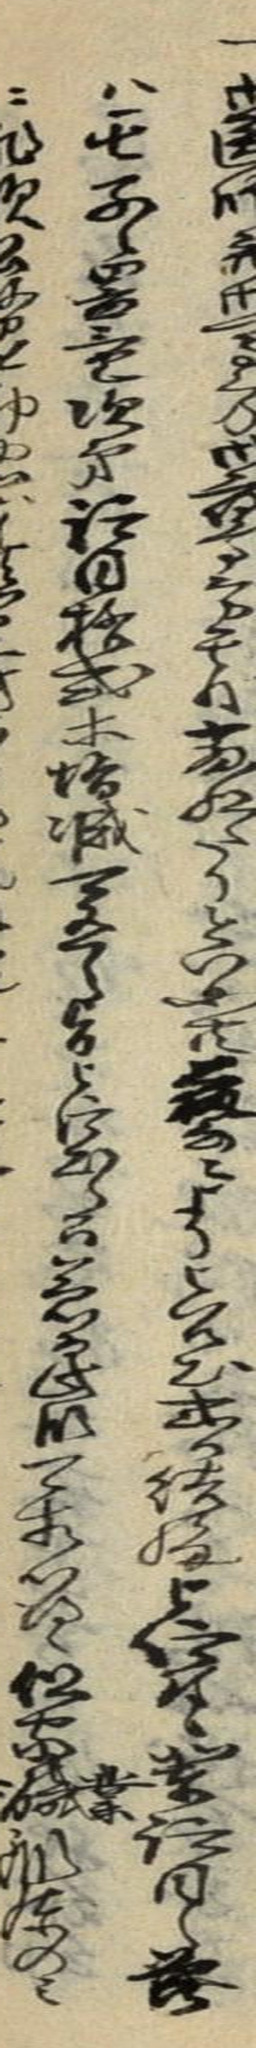は其子之器量次第跡目格式等増減可有之旨被仰出候間兼而此段可相心得候但家業鍛練のみ
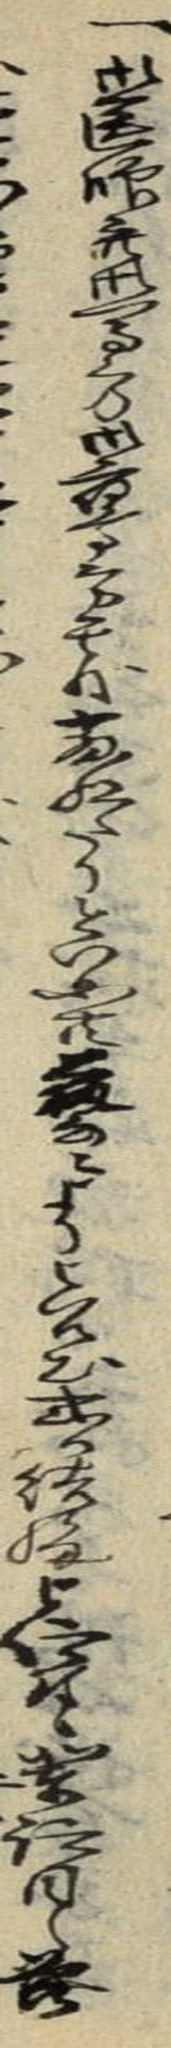一御医師并御馬方御鷹方其外番組たりといふ共芸により被召出或は結構被仰付候輩跡目之節
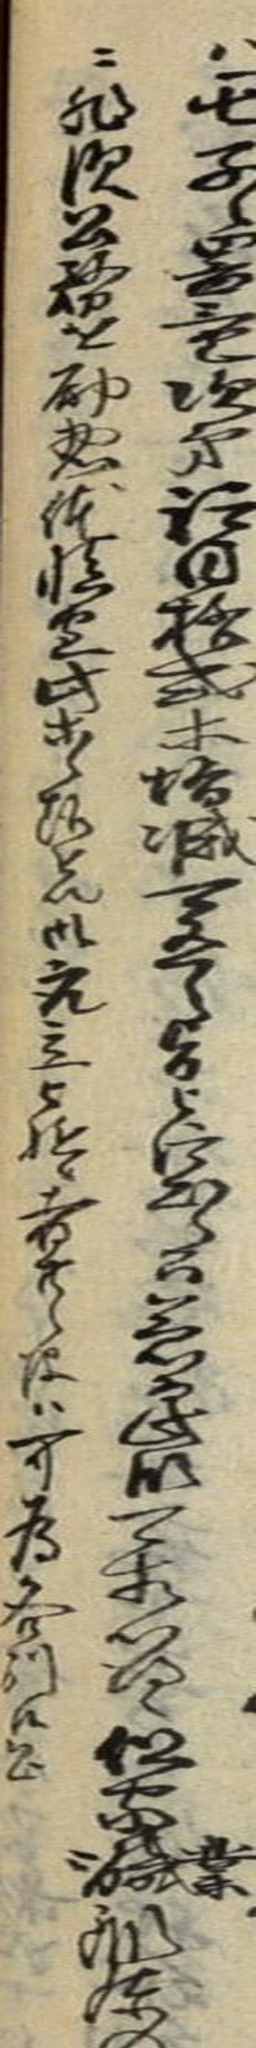に非須公務を勤惣体慎宜此等之趣を以御取立被遊候者共之儀は可為各別候以上
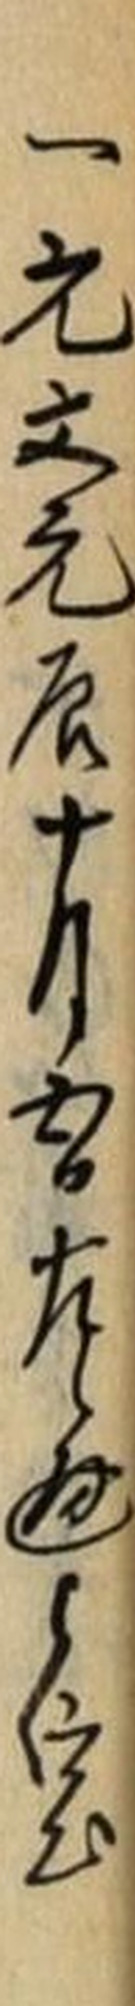一元文元辰十月五日左之通被仰出
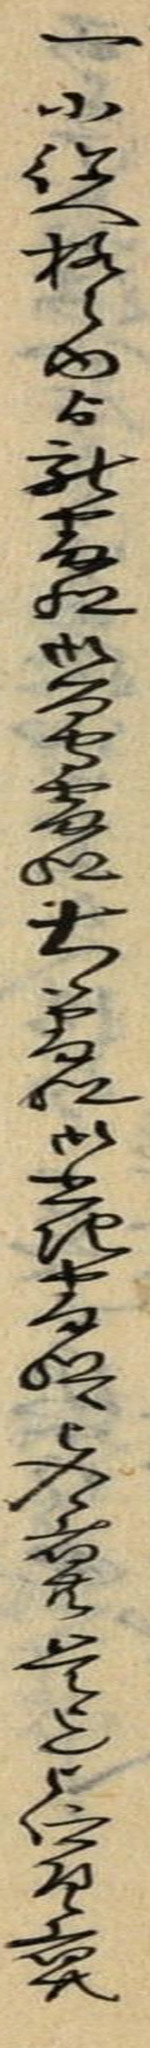一小役人格之内ゟ新番組御留守番組大御番組御書院番組へ被入候者共是迄被仰付候者共
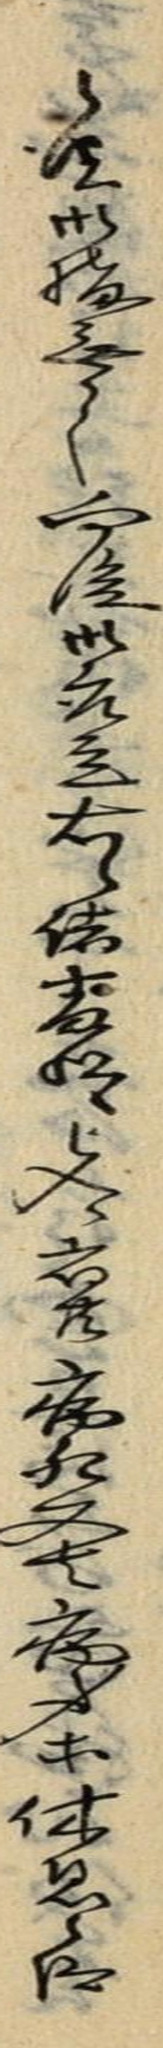之儀は御構無之向後御取立右之諸番組へ被入候者共病死又は病身等休息被仰
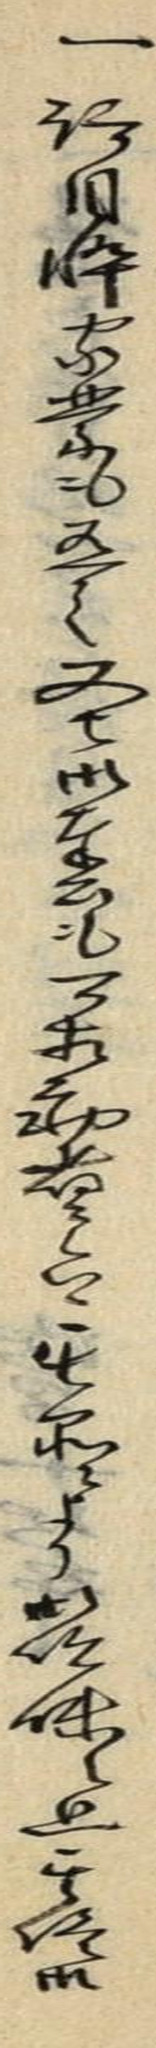一跡目忰家業も有之又は御奉公も可相勤候者に候はゝ其品により御吟味之上其侭御
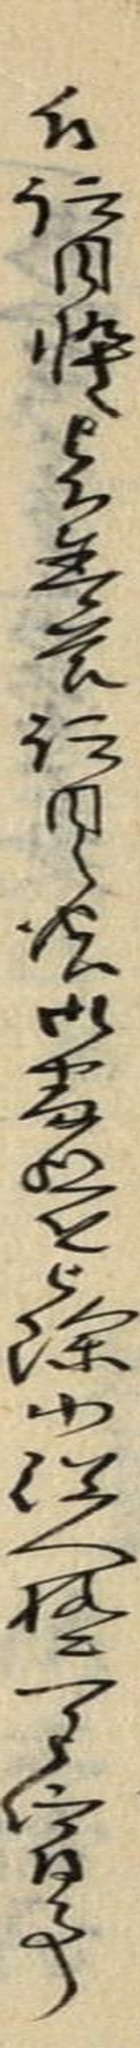付跡目忰へ被下置候節跡目之儀は御番組を被除小役人格に可被仰付事
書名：御用并被仰出之部
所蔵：福井県文書館 Fukui Prefectural Archives
